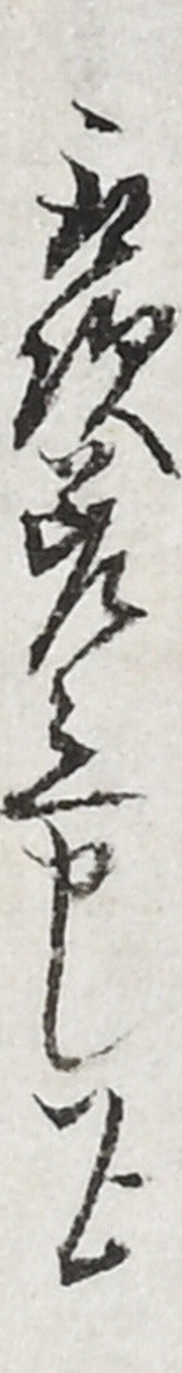取次差上申候以上
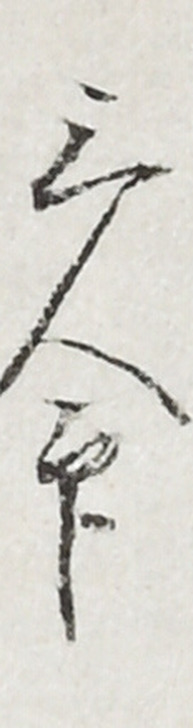三人印
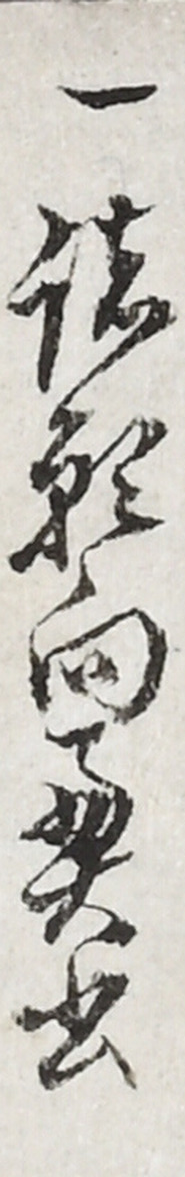一諸願向奥書
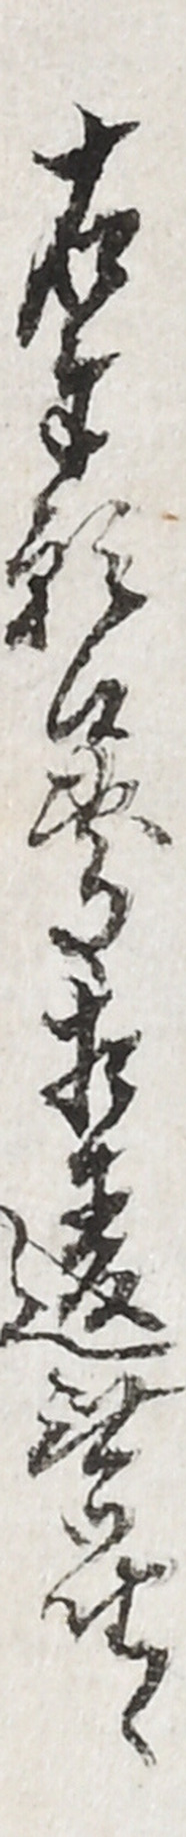右奉願候処相違無御座候
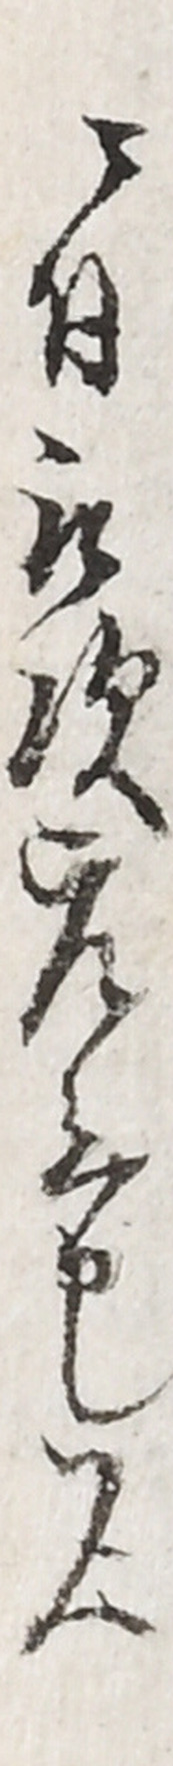ニ付取次差上申候以上
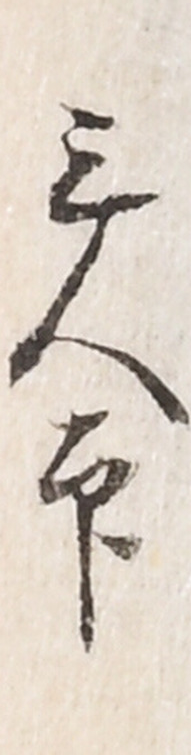三人印
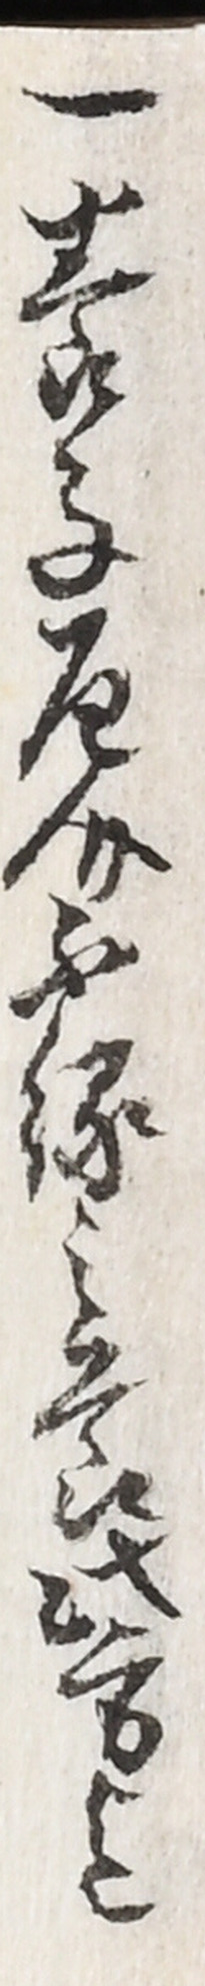一養子厄介不縁之節此方迄
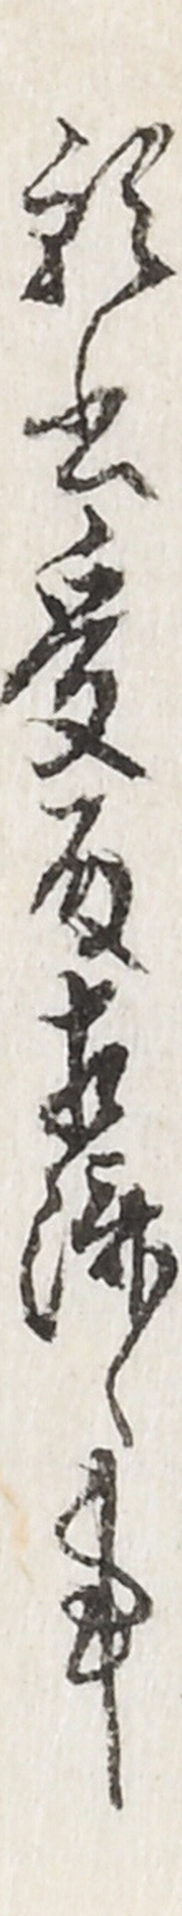願書受取相済候事
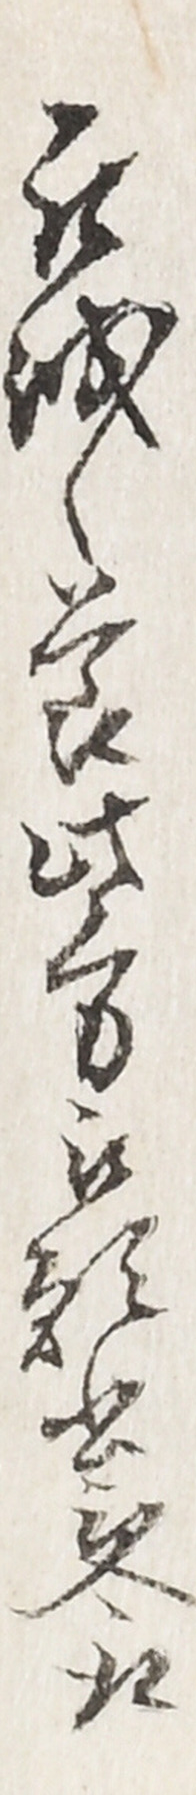罷越候節此方被願書受取
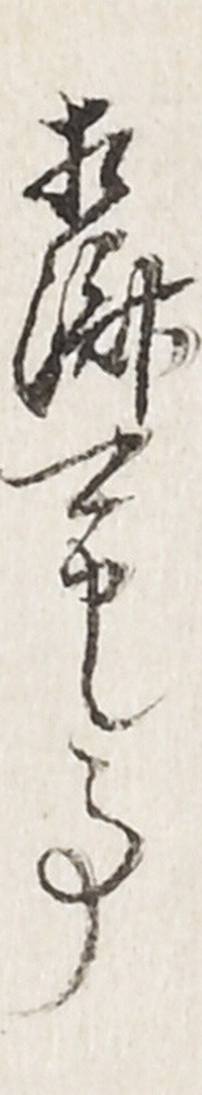相済可申候事
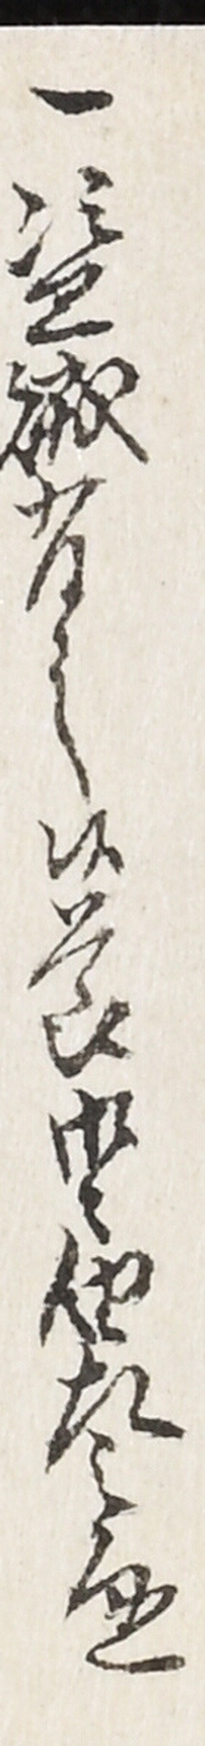一盗賊有之候節御届左之通
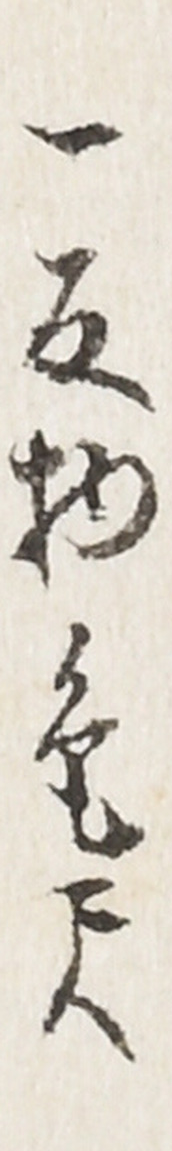一反物壱尺
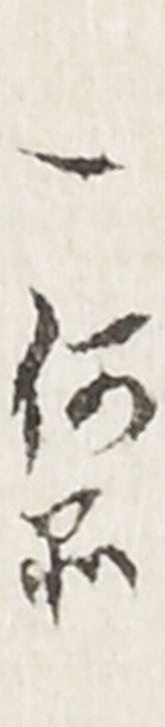一何品
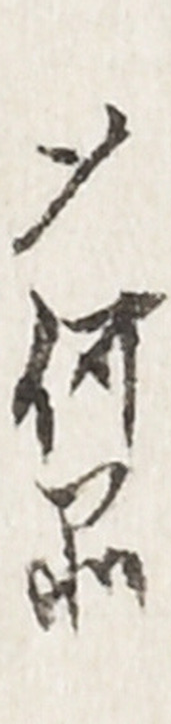〆何品
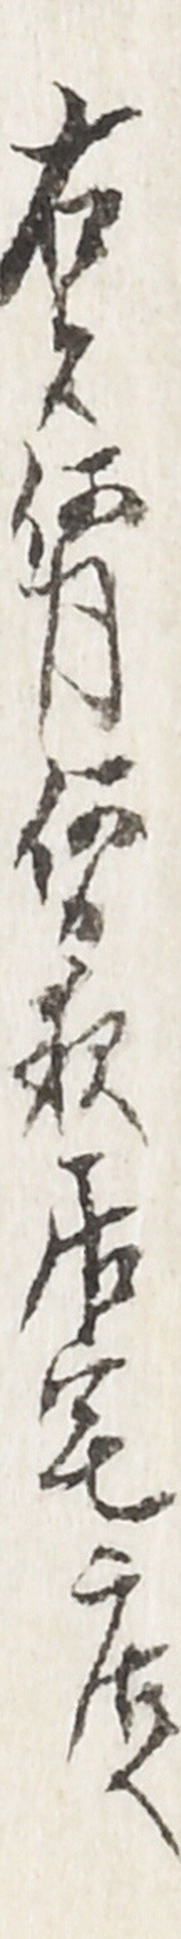右は何月何日夜居宅店へ
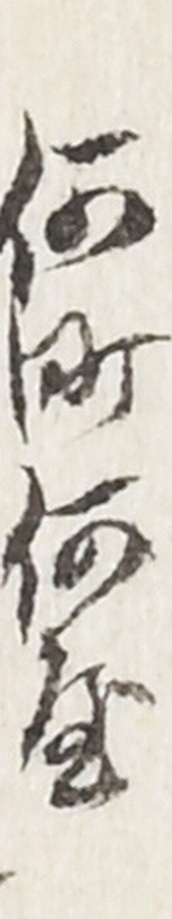何町何屋
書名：年内行事懐中録
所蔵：伊那市立高遠町図書館・合同会社AMANE
